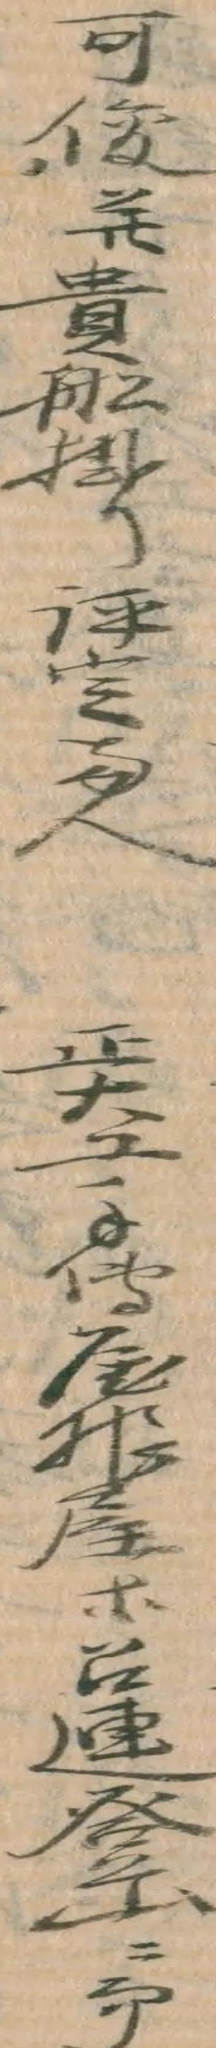可俊并貴船掛リ評定両人正大工手傳屋根屋等召連登山ニ而
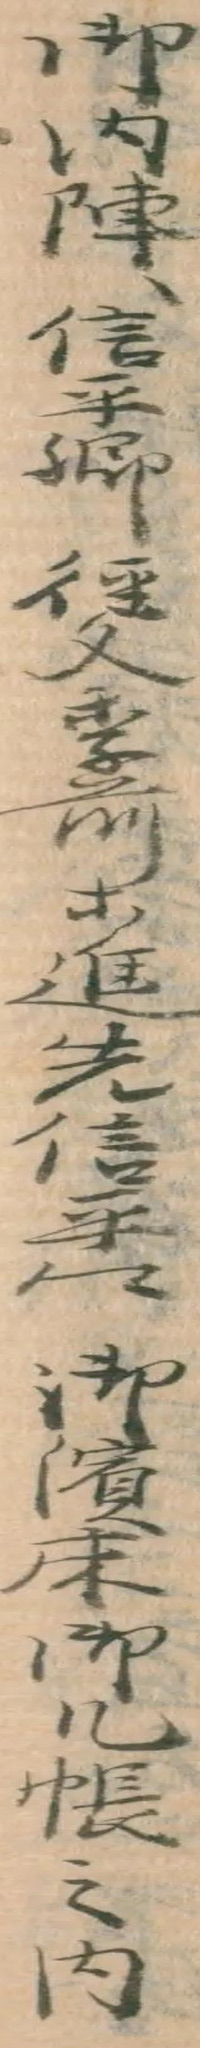御内陣へ信平卿径久季前等進先信平卿御濱床御几帳之内
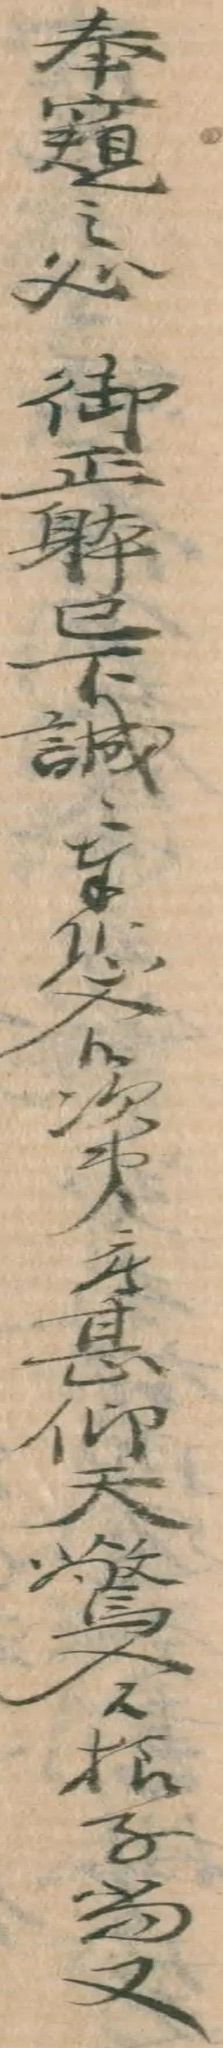奉窺之処御正躰已下誠ニ奉恐入候次第ニ付甚仰天驚入候様子尚又
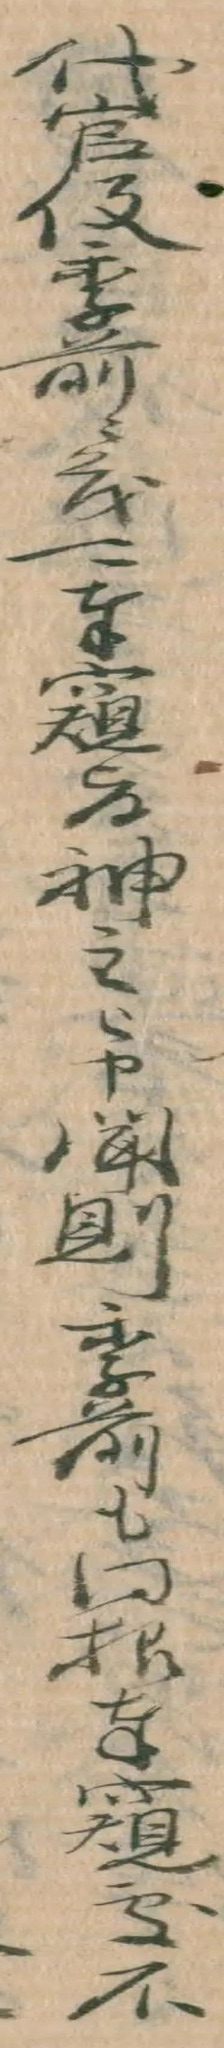代官役季前ニも可奉窺旨神主被申聞則季前も同様奉窺處不
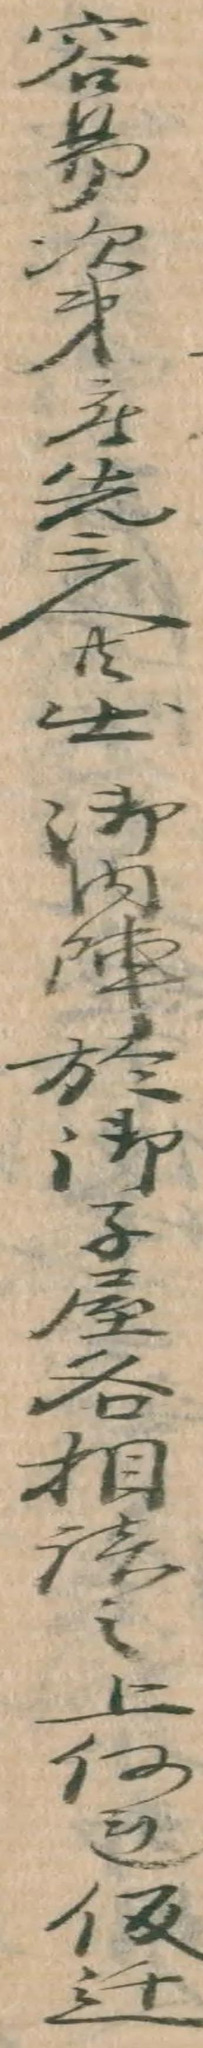容易次第ニ付先三人共出御内陣於御子屋各相談之上何れ仮遷
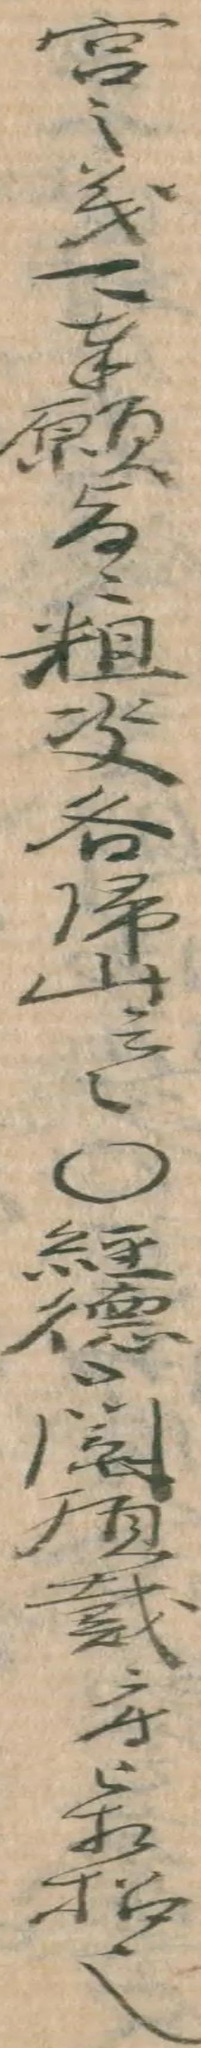宮之義可奉願旨に粗決各帰山云〻〇経徳御鬮頂戴ニ付被相招候
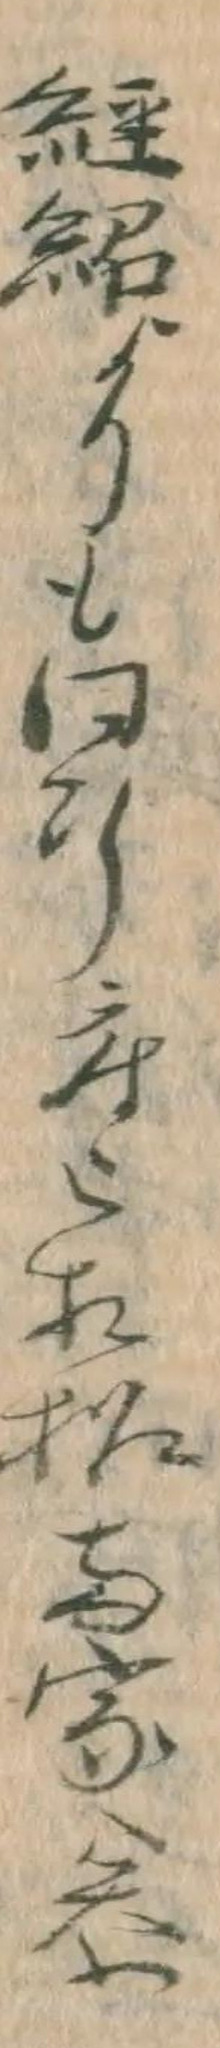経紹よりも同断ニ付被相招両家へ参
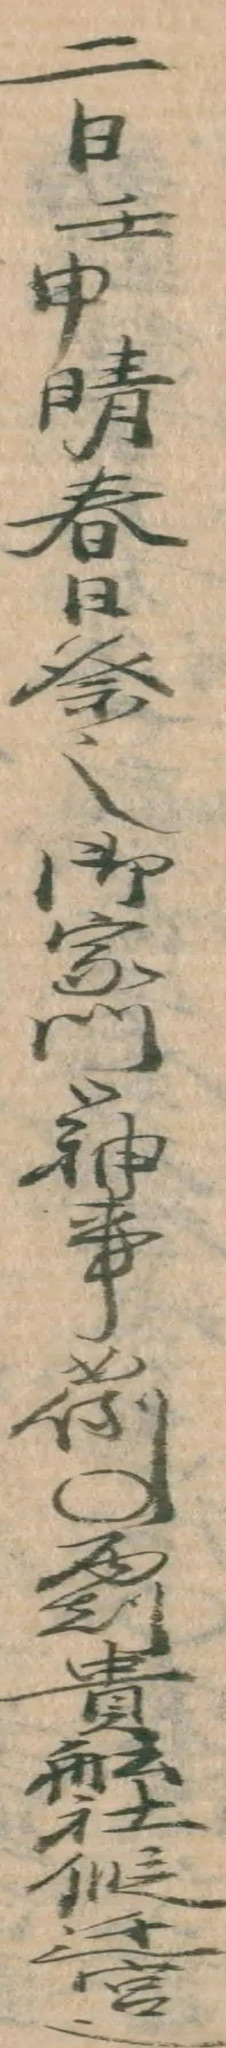二日壬申晴春日祭也御家門御神事如例〇酉刻貴舩社仮遷宮
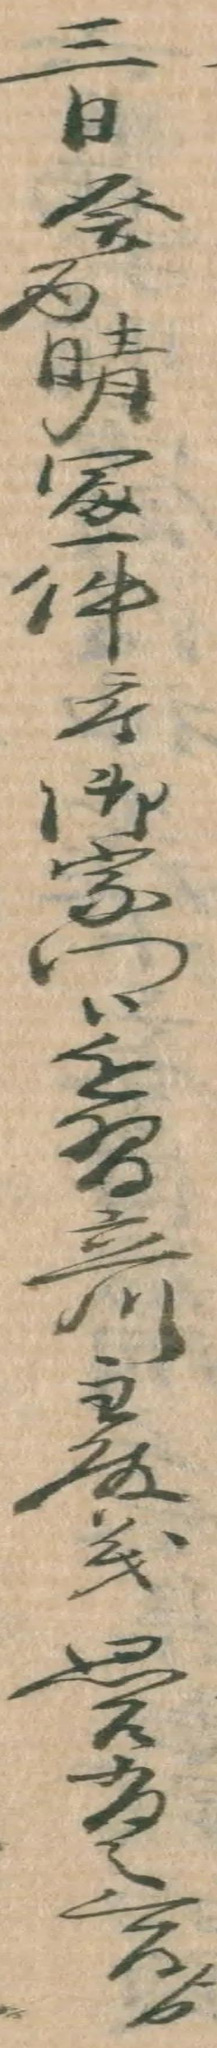三日癸酉晴冨一件ニ付御家門御近習立川主殿義思召有之今日ゟ
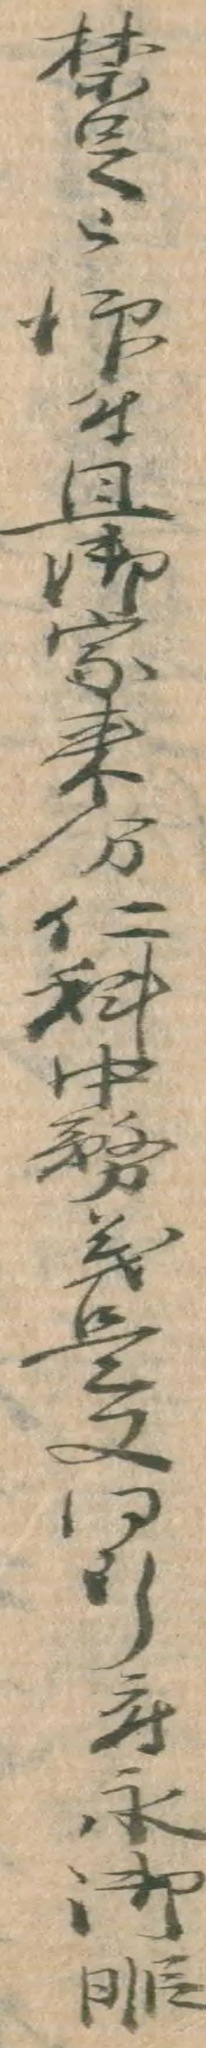禁足被仰付且御家来分仁科中務義是又同断ニ付永御暇
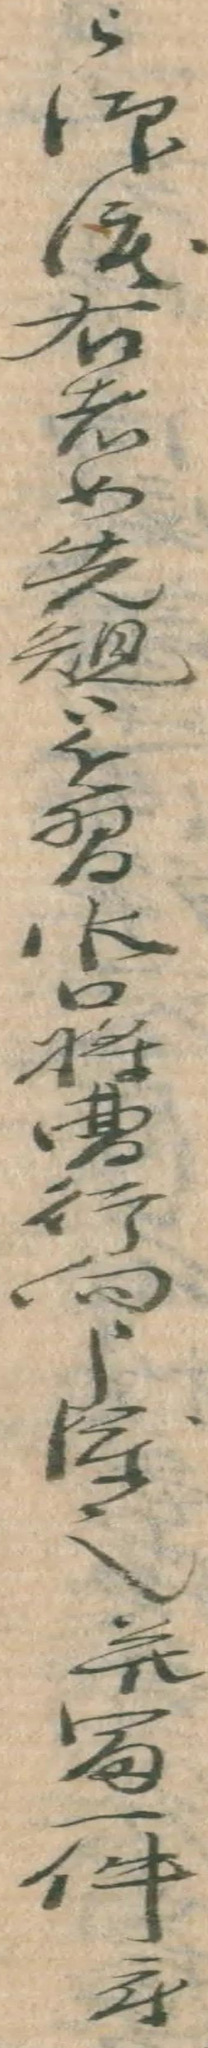被仰渡右者先規御近習水口将曹行向申渡也并冨一件ニ付
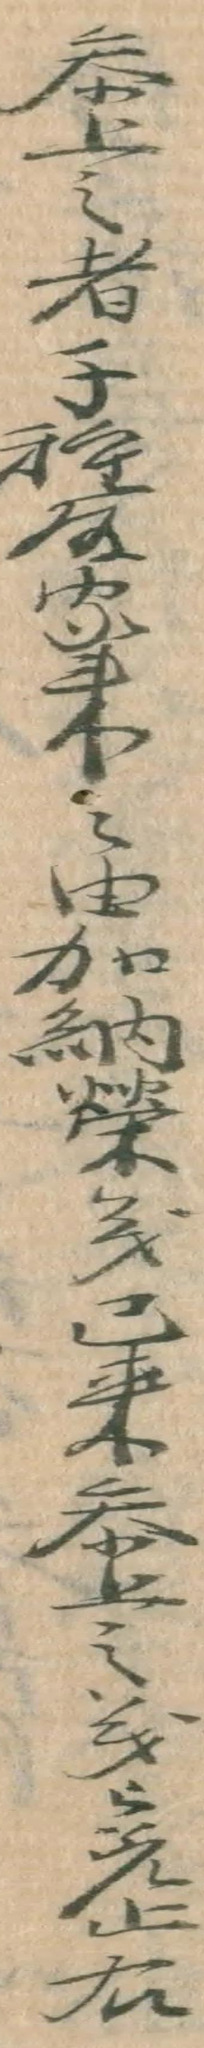参上之者子種故家来之由加納榮義已来参上の義被差止右
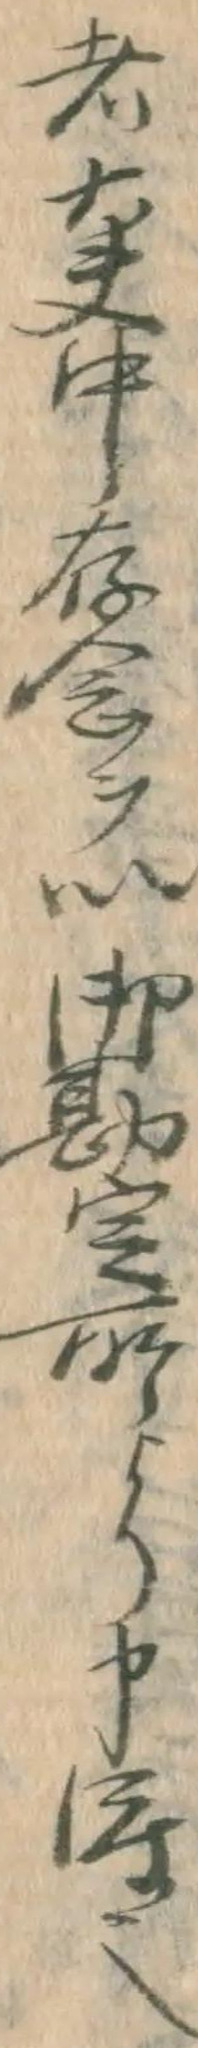者大夫中存念ヲ以御勘定所より申渡之
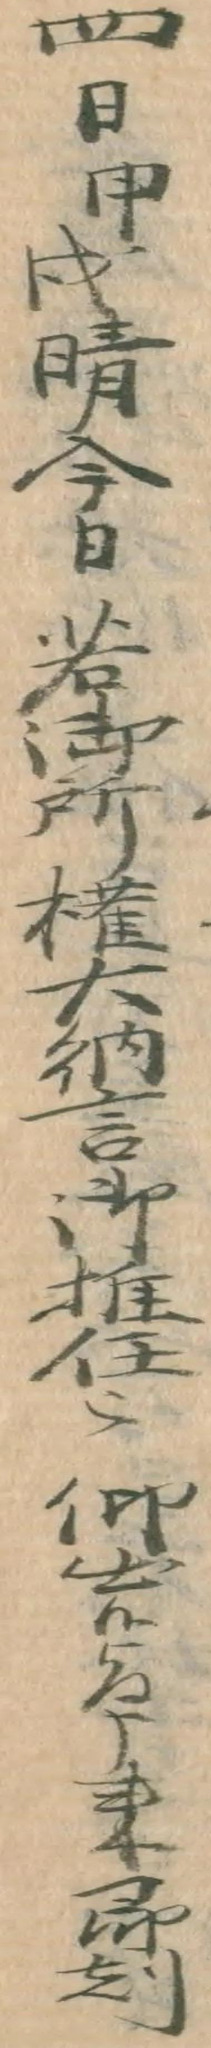四日甲戌晴今日若御所権大納言御推任被仰出候旨申来即刻

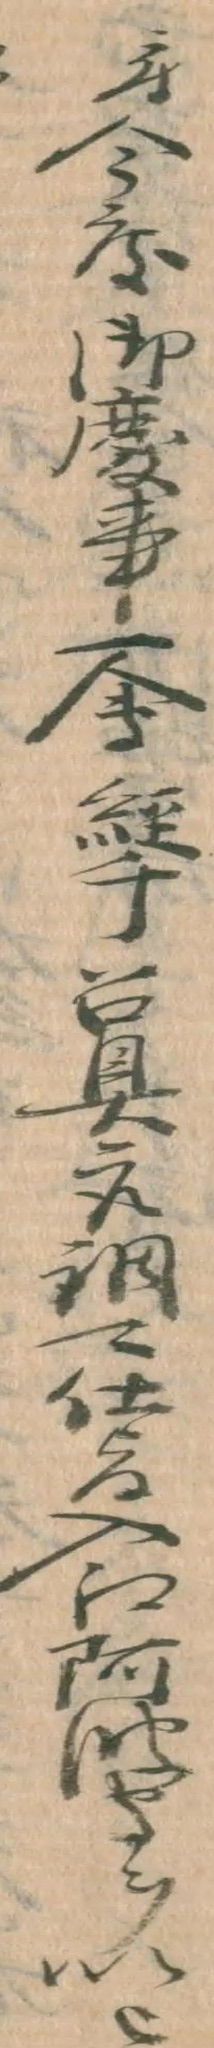ニ付今度御慶事一會経千召具取調可仕旨入江阿波守ヲ以被
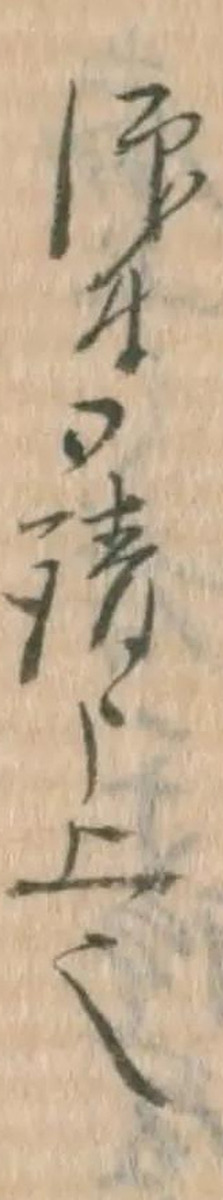仰付御請申上也
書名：賀茂社記録. 第65冊
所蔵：国立国会図書館 National Diet Library, JAPAN
